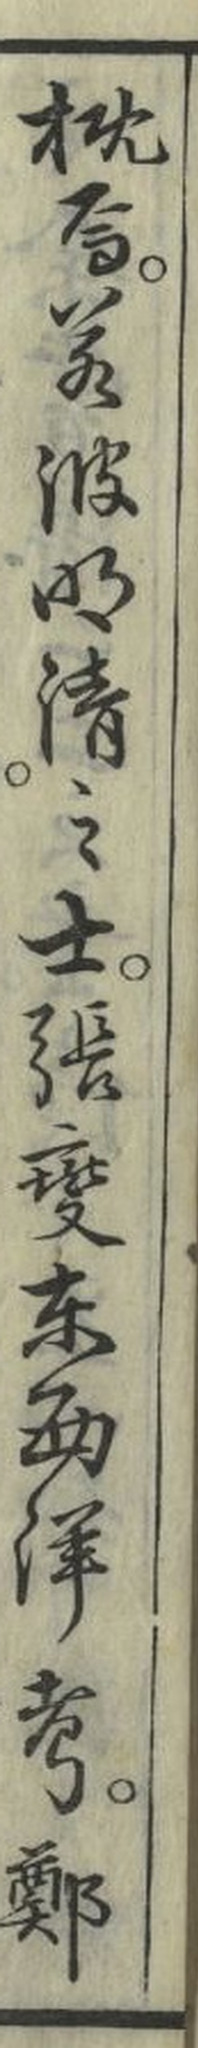概焉。若波明請之士。張變東西洋考。鄭
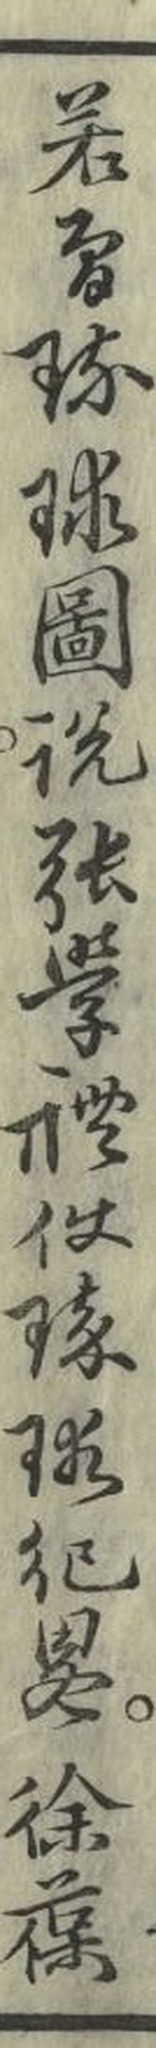若曾琉球圖説。張學禮使琉球紀畧。徐葆
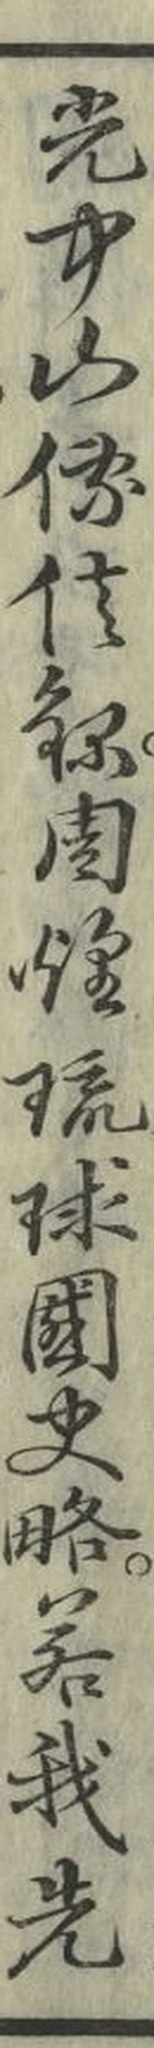光中山傳信録。周煌琉球國史略。若我先
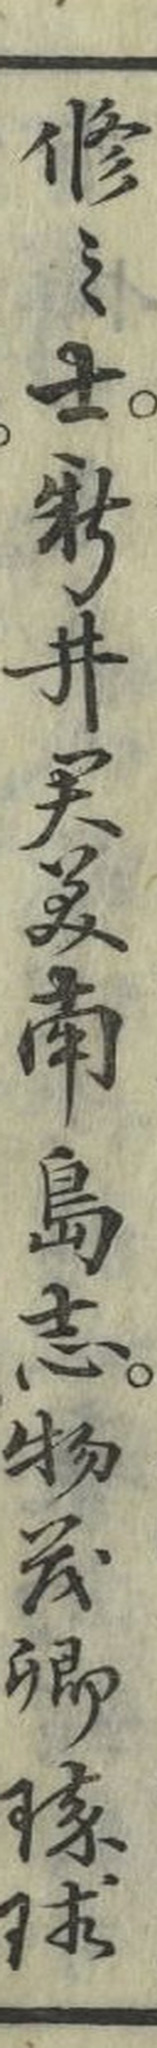修之士。新井君美南島志。物茂卿琉球
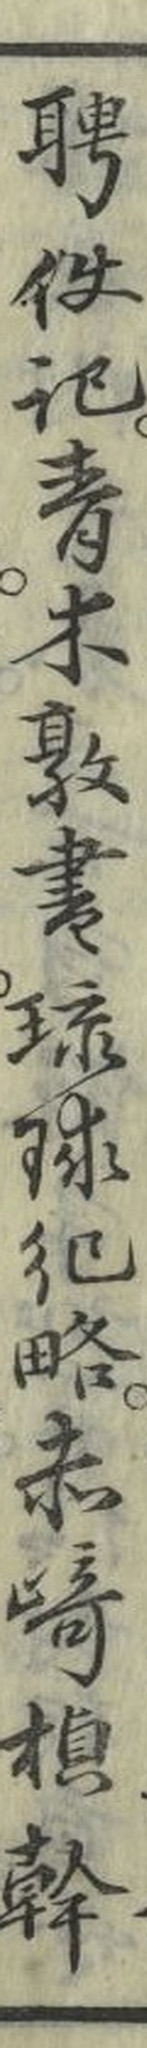聘使記。青木敦書琉球紀畧。赤崎楨幹
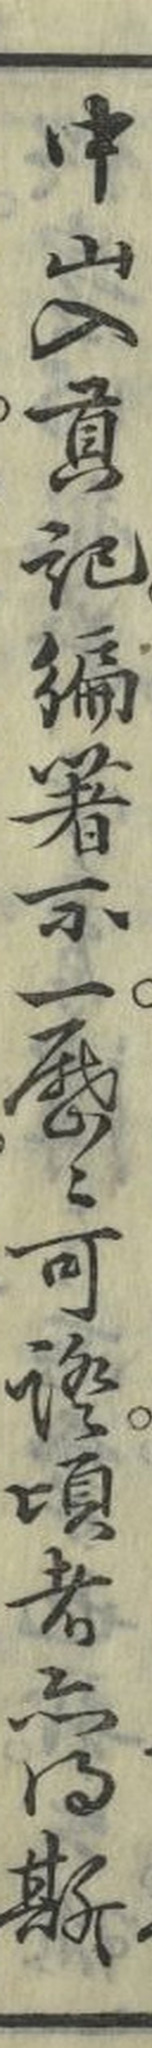中山入貢記。編著不一。歴々可證。頃者亦得斯
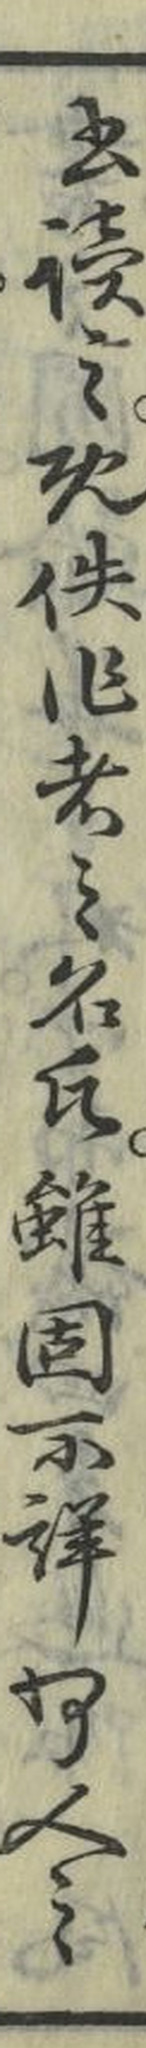書読之。既佚非考之名氏。雖固不詳為人之
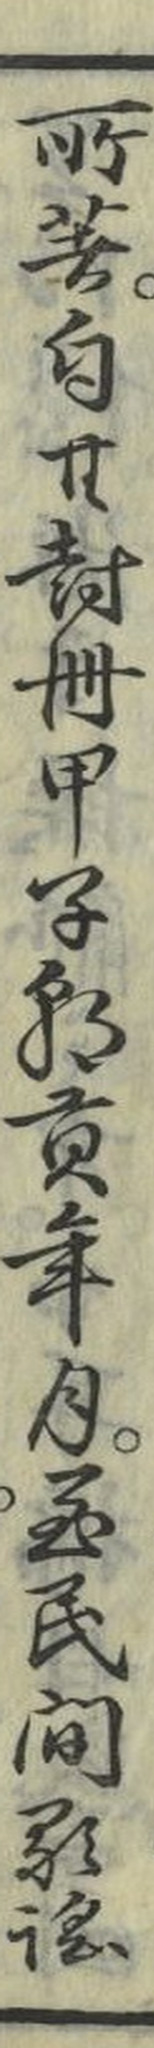所著。自其封冊甲子朝貢年月。至民間歌謡
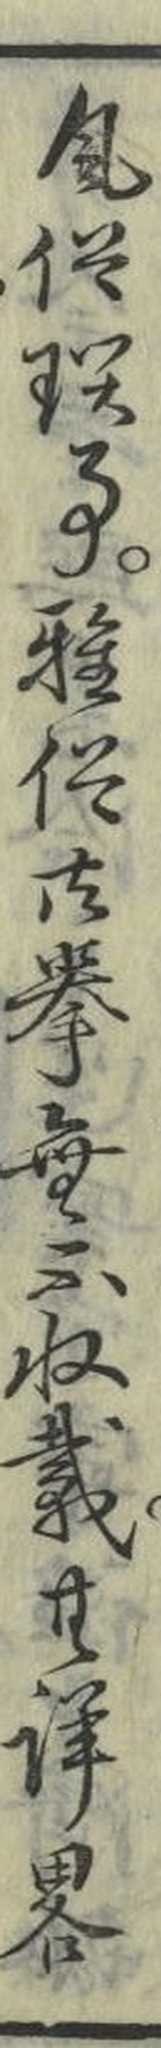風俗理事。雅俗古拳無不収載。其詳畧
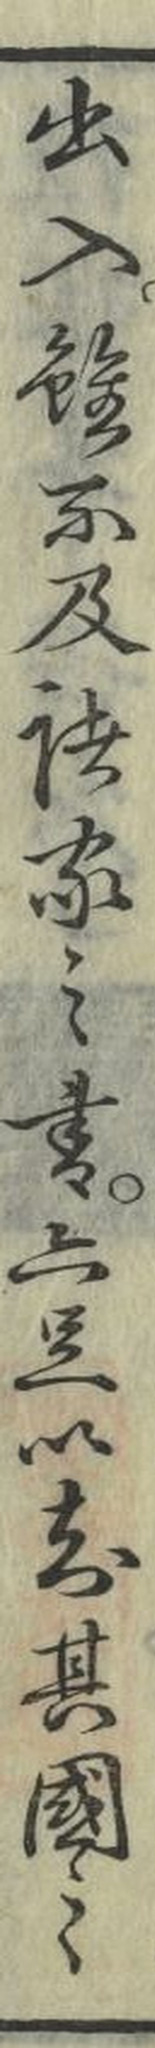出入。雖不及諸家之書。亦足以知其國之
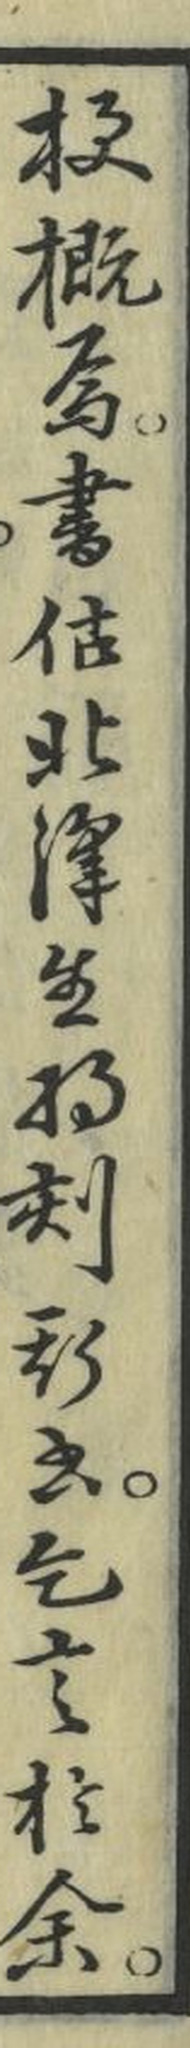梗概焉。書估北降生持刻斯書。乞言於余。
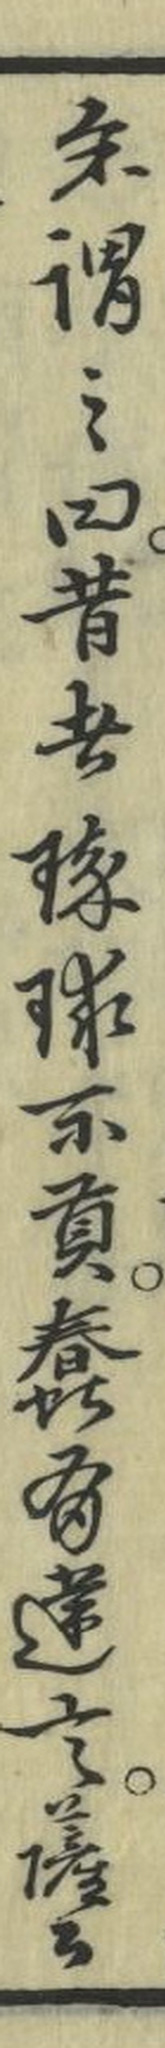余謂之曰。昔者琉球不貢。蠢有違言。薩即
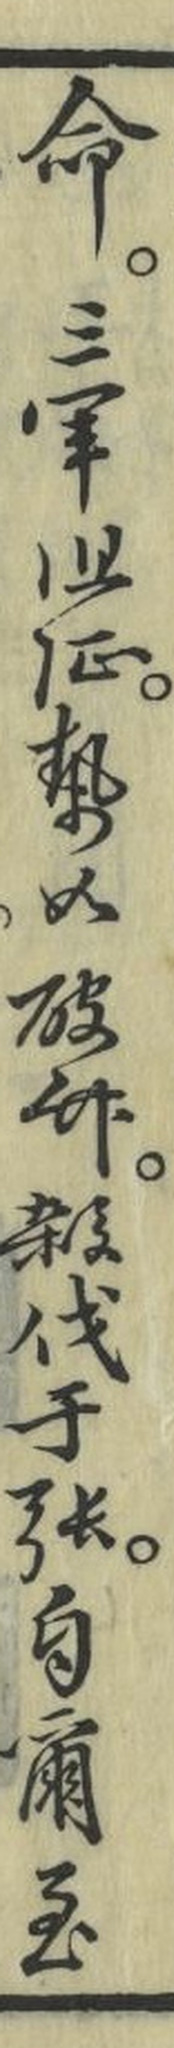命。三軍此征。勢如破竹。殺伐于張。自爾至
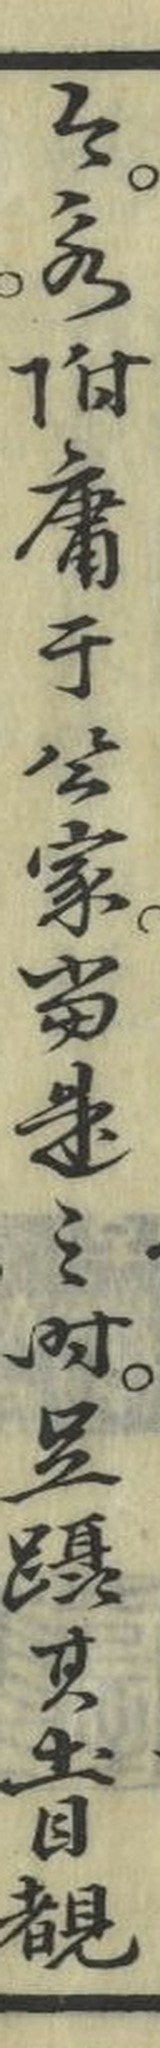今。氷附庸于公家。当迷之時。足躡其土目覩
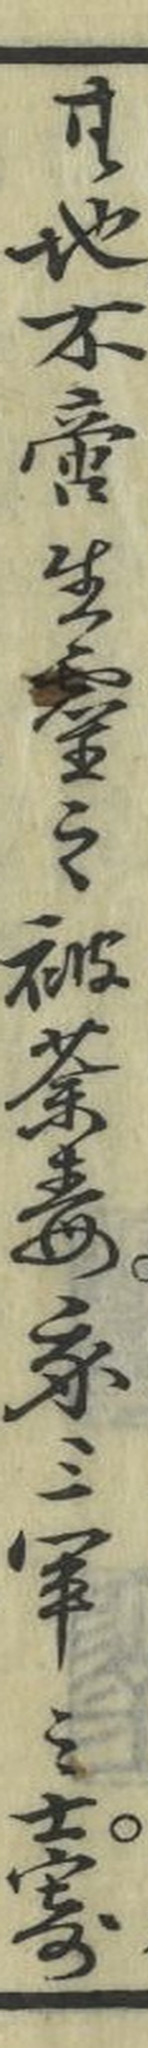其地。不啻生悪王之被荼毒。我三軍之士。寄
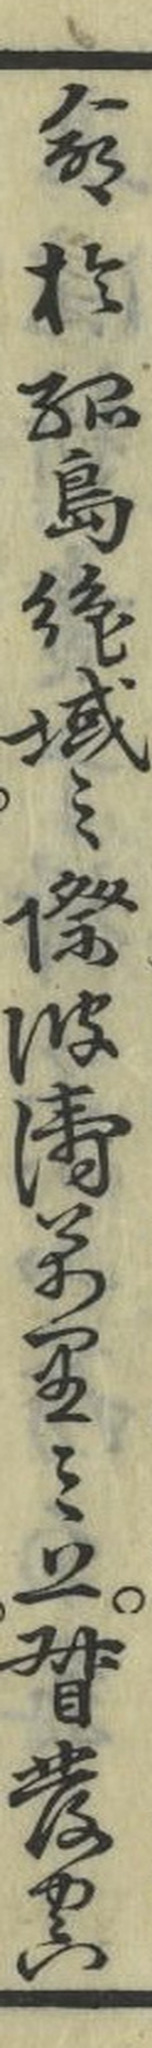命於孤島絶域之際波濤萬里之上。督慶真
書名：琉球秊代記 附雑話 全
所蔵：University of the Ryukyus Library
